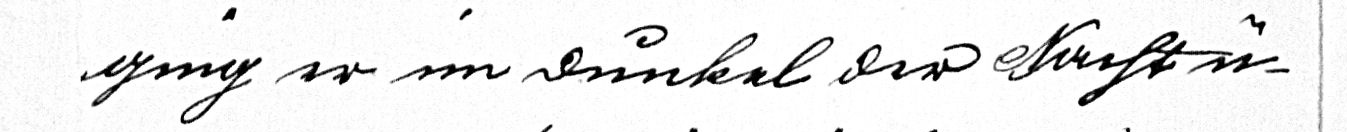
ging er im Dunkel der Nacht ü¬
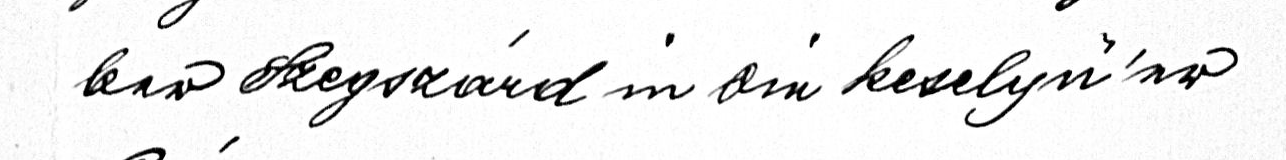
ber Szegszárd in die keselÿn'er
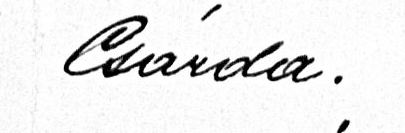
Csárda.
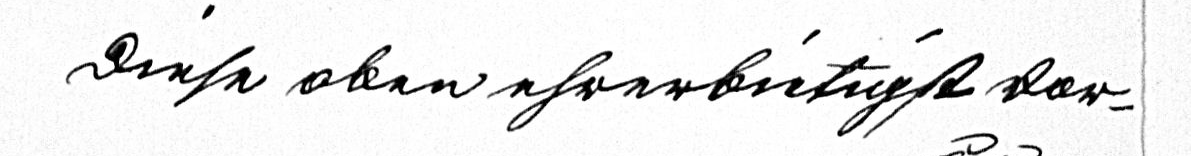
Diese aber ehrerbietigst vor¬
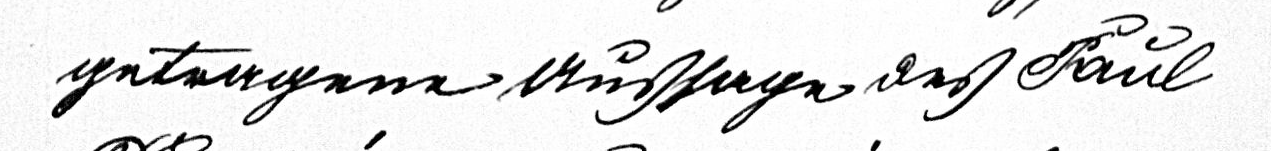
getragene Aussage des Paul
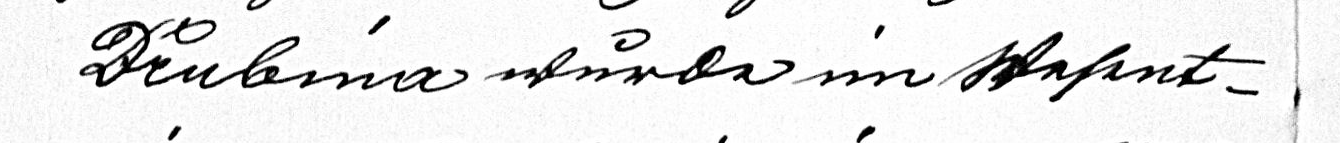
Drubina wurde im Wesent¬
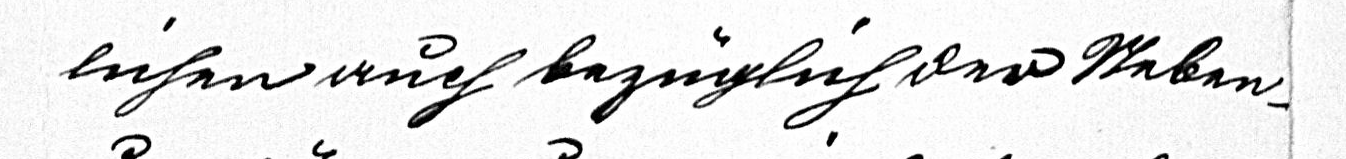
lichen auch bezüglich der Neben¬
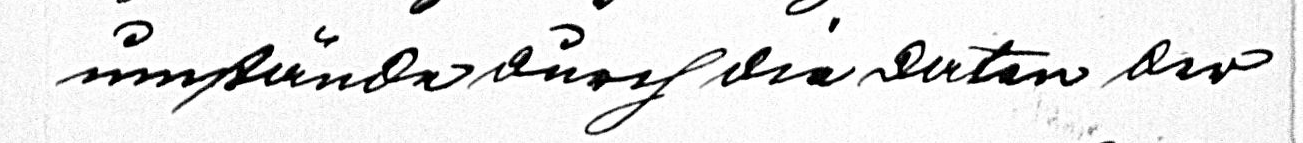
umstände durch die Daten der
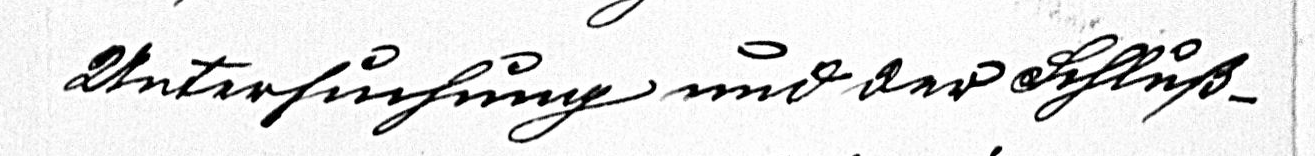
Untersuchung und der Schluß¬
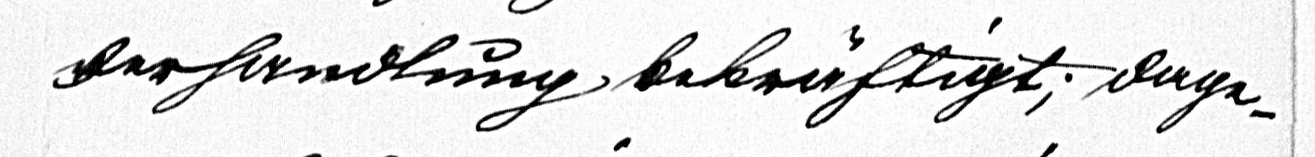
verhandlung bekräftigt; dage¬
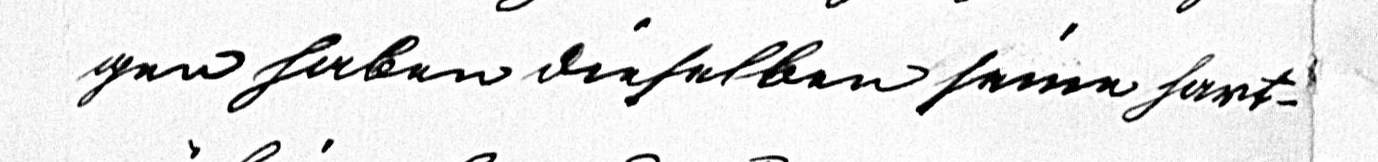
gen haben dieselben seine hart¬
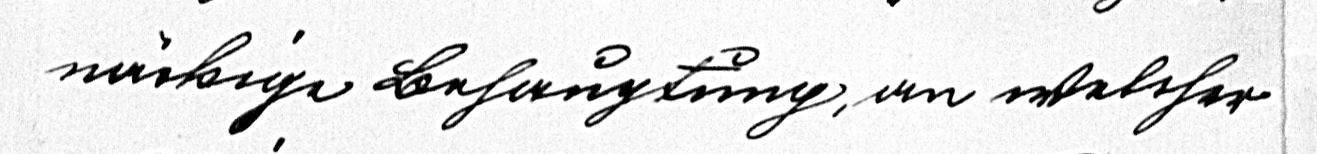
näckige Behauptung, an welcher
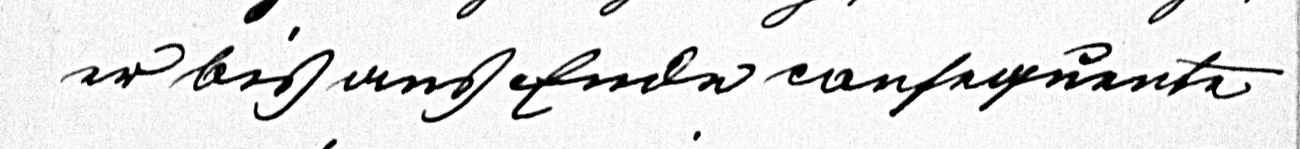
er bis ans Ende consequente
